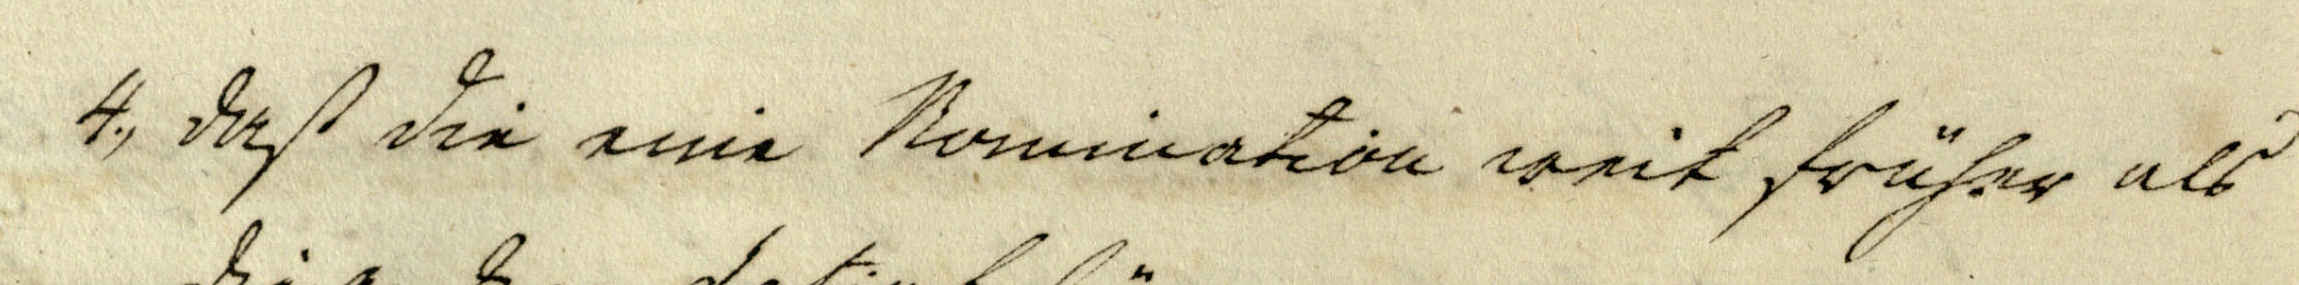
4., daß die eine Nomination weit früher als
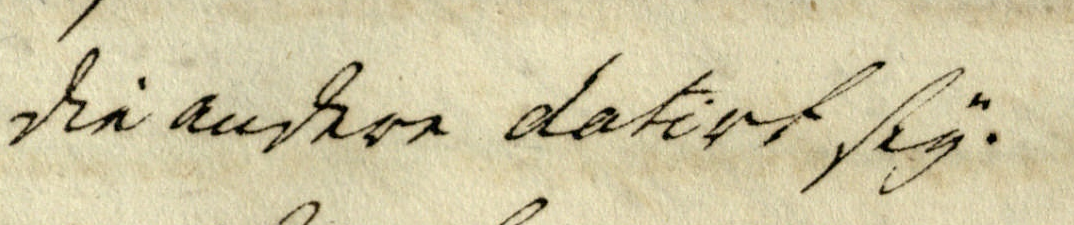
die andere datirt seÿ.
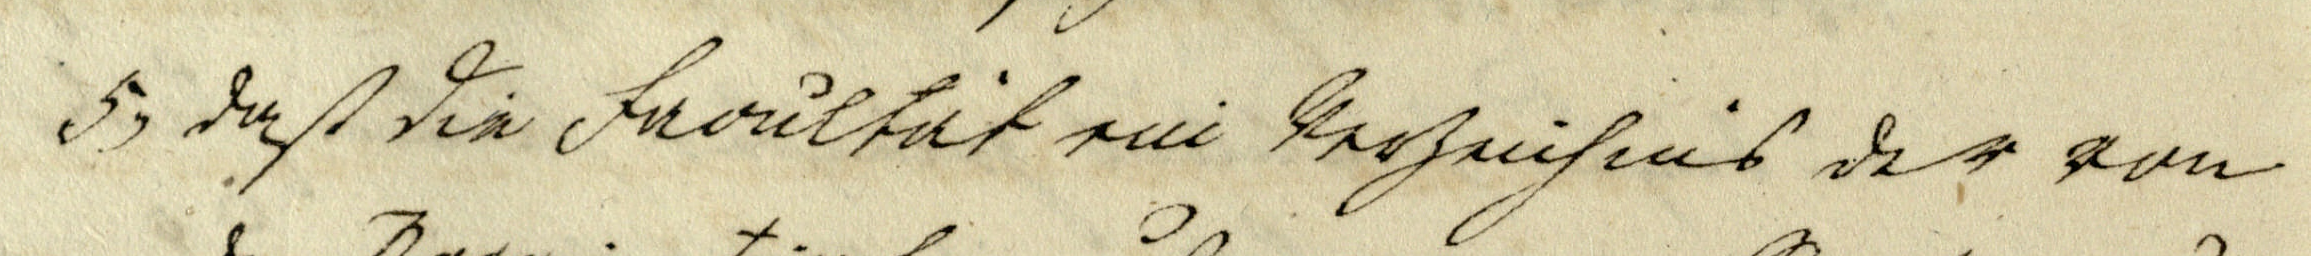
5., daß die Facultät ein Verzeichnis der von
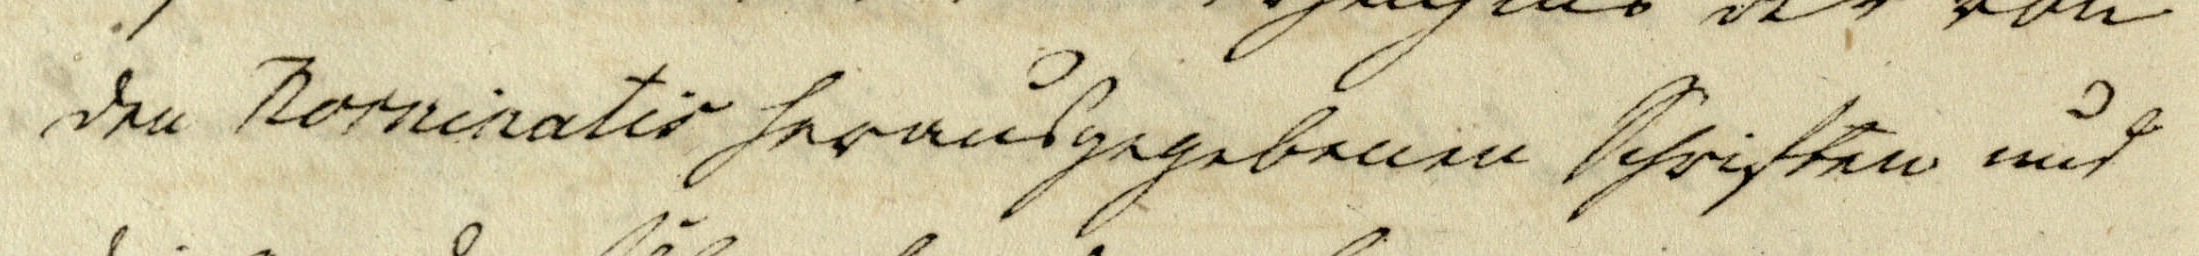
den Nominatis herausgegebenen Schriften und
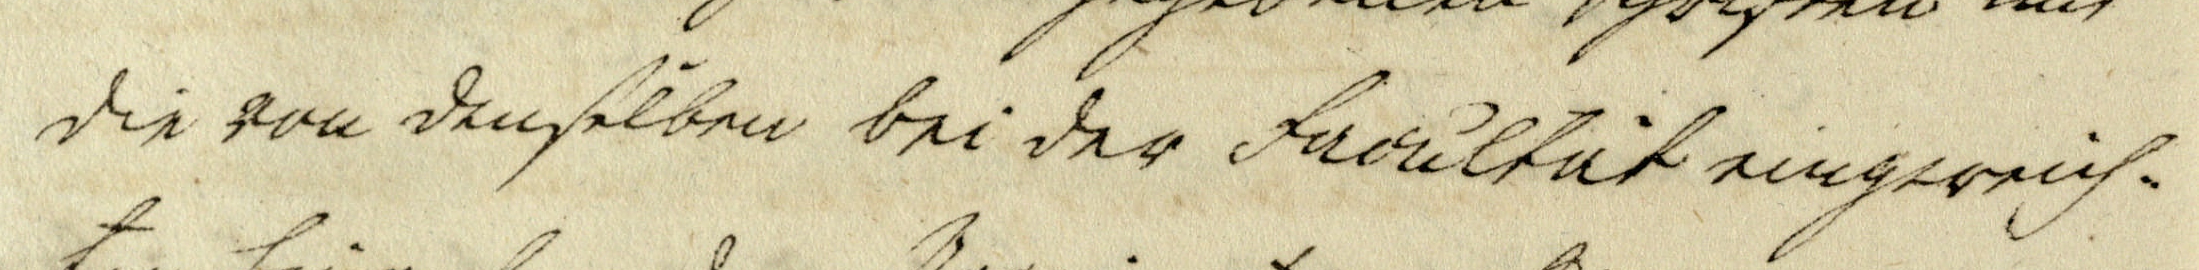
die von denselben bei der Facultät eingereich¬
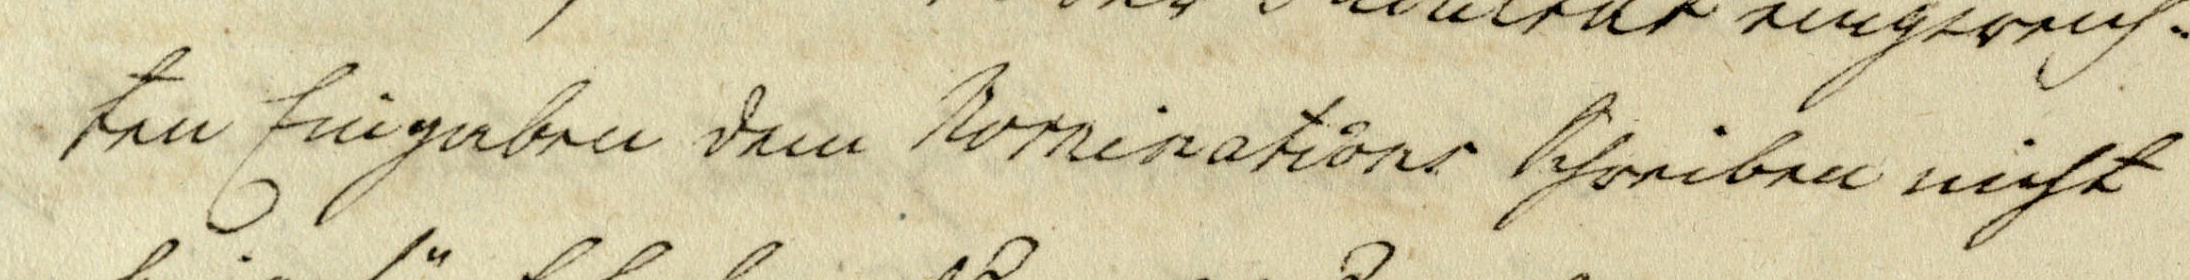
ten Eingaben dem Nominations Schreiben nicht
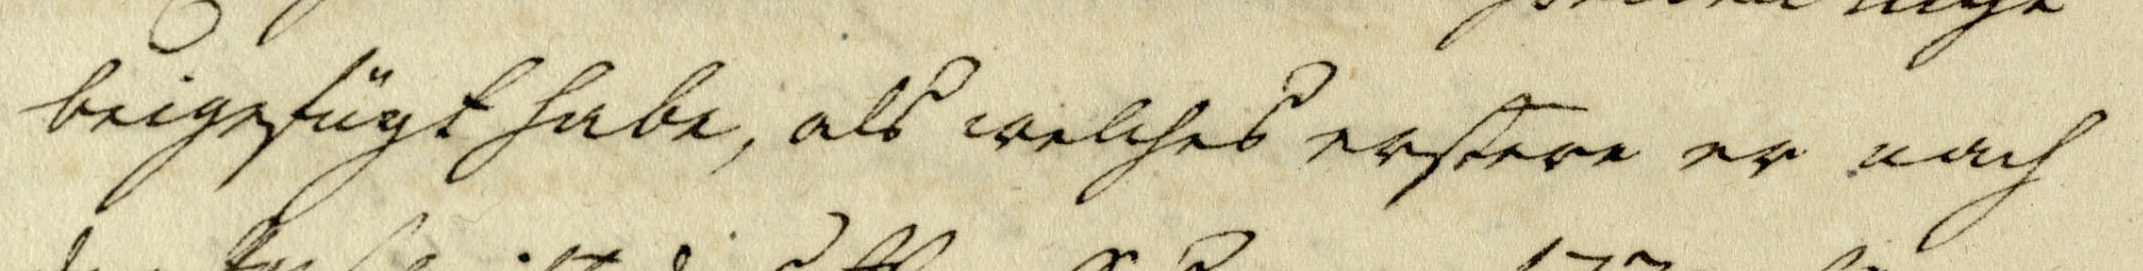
beigefügt habe, als welches erstere er nach
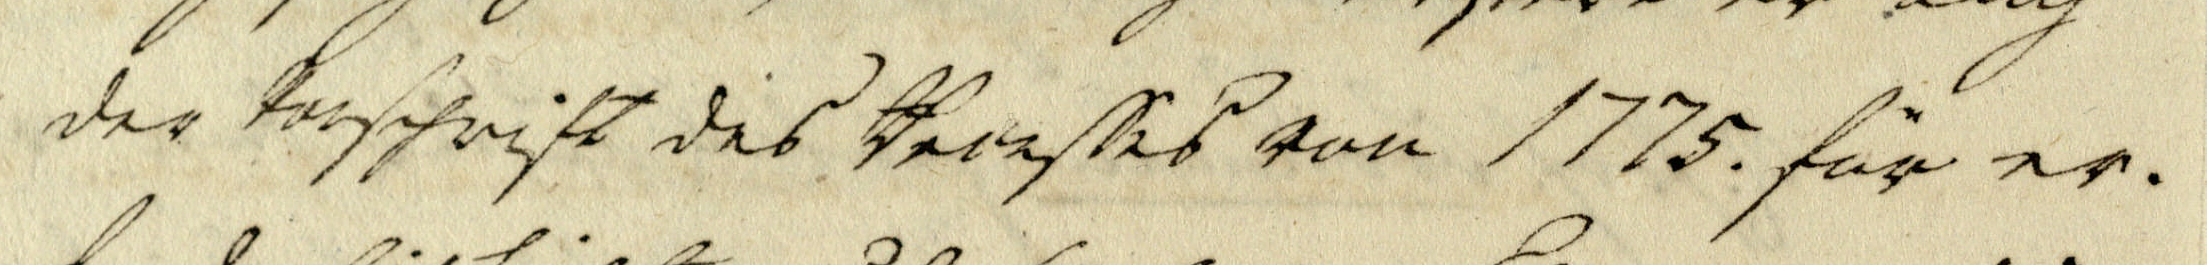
der Vorschrift des Recesses von 1775. für er¬
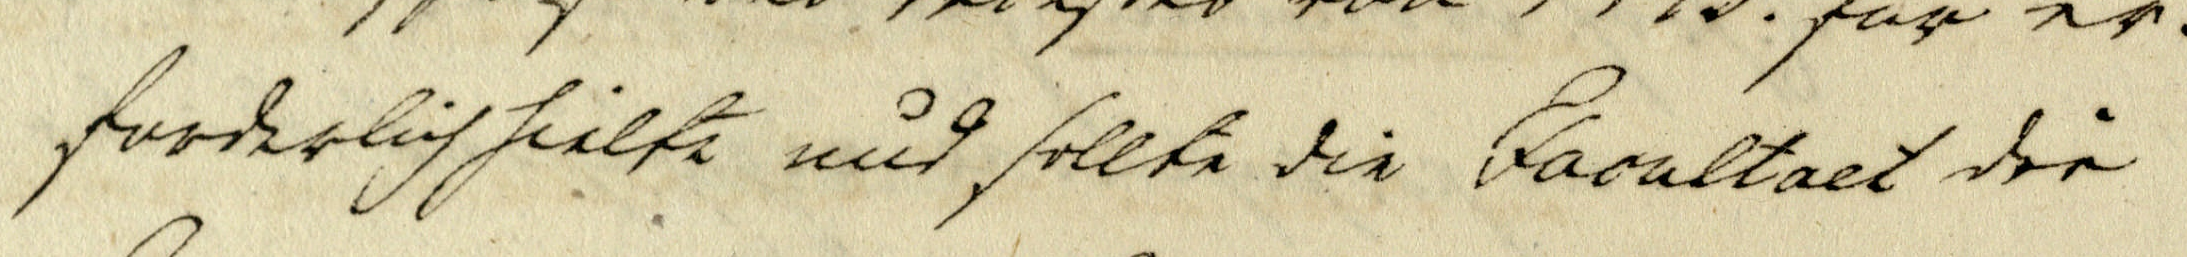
forderlich hielte und sollte die Facultaet die
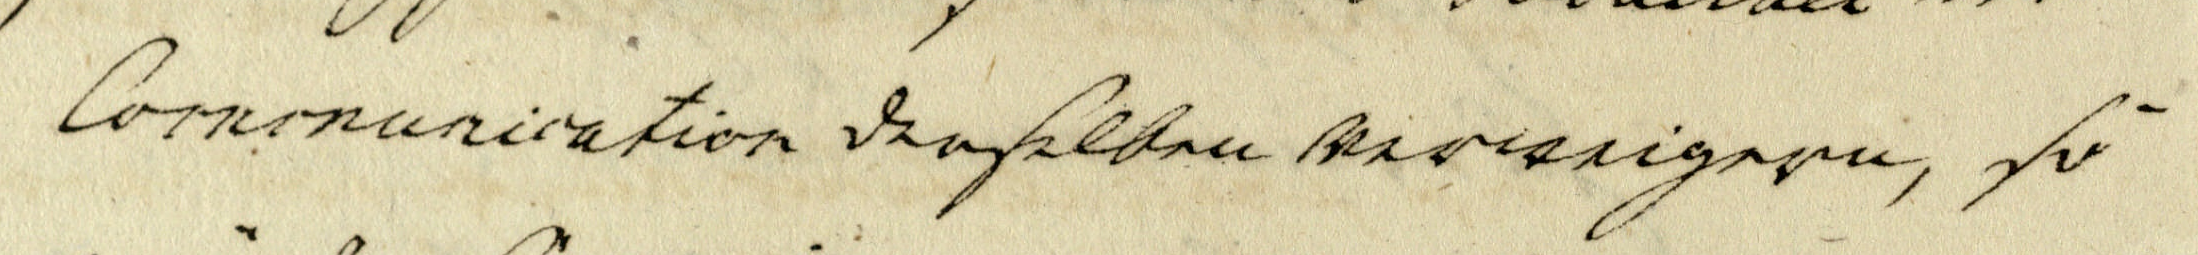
Communication derselben verweigern, so
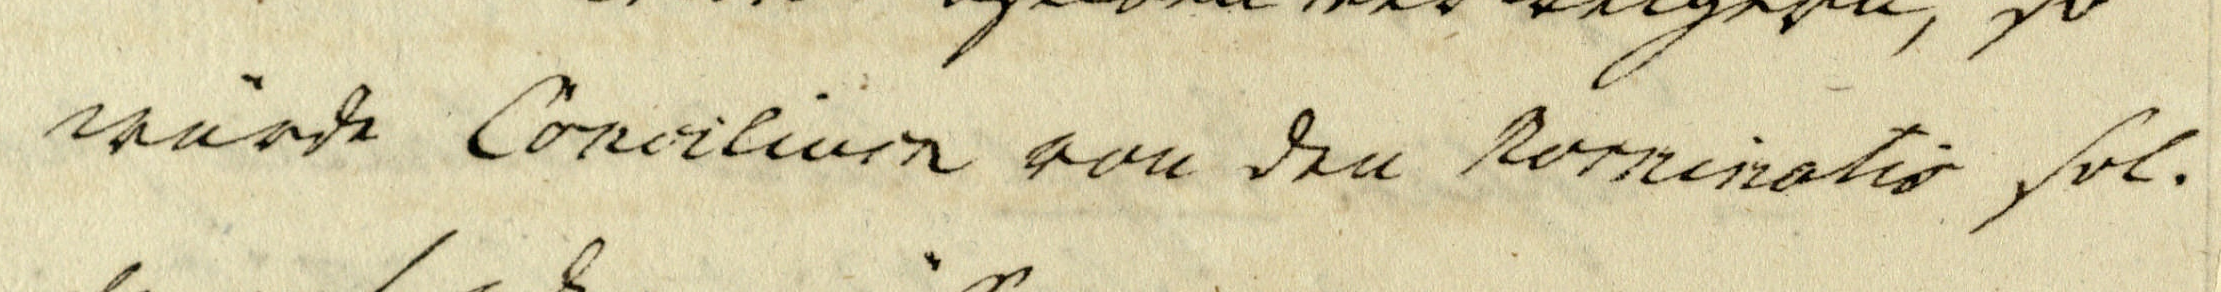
würde Concilium von den Nominatis sol¬
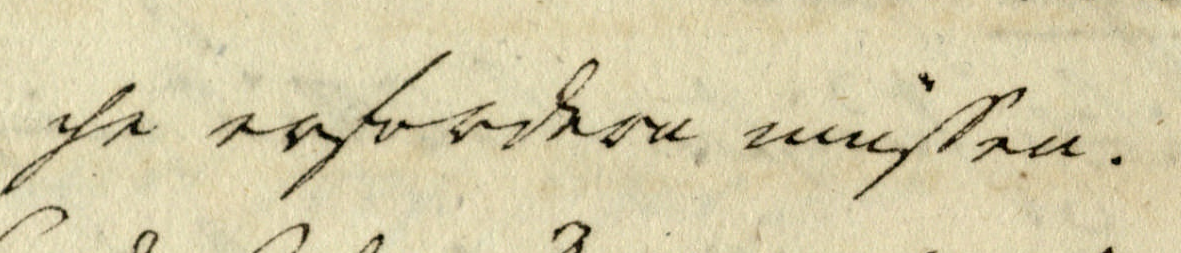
che erfordern müssen.
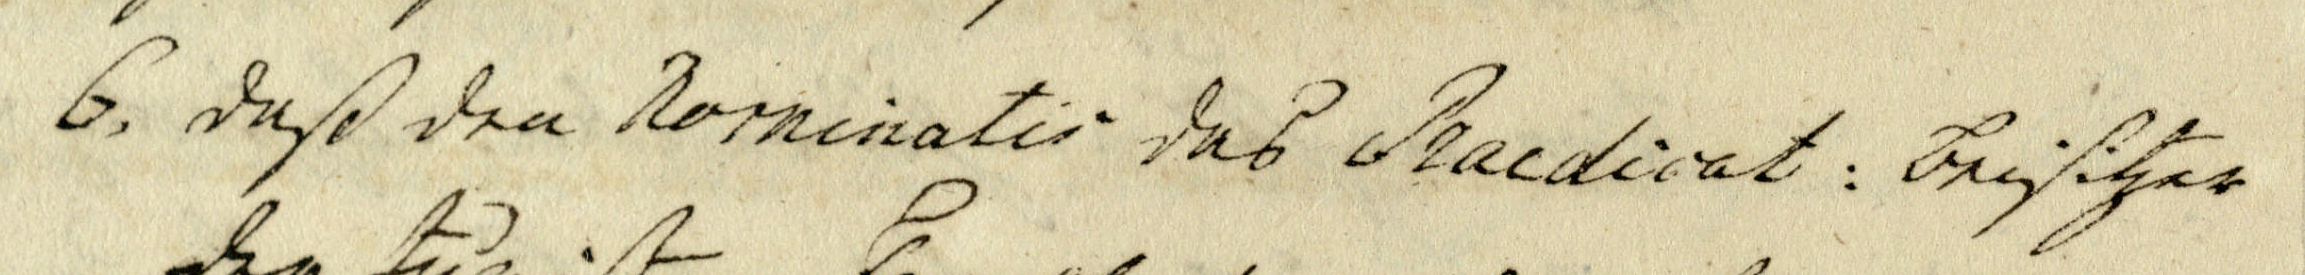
6., daß den Nominatis das Praedicat: Beisitzer
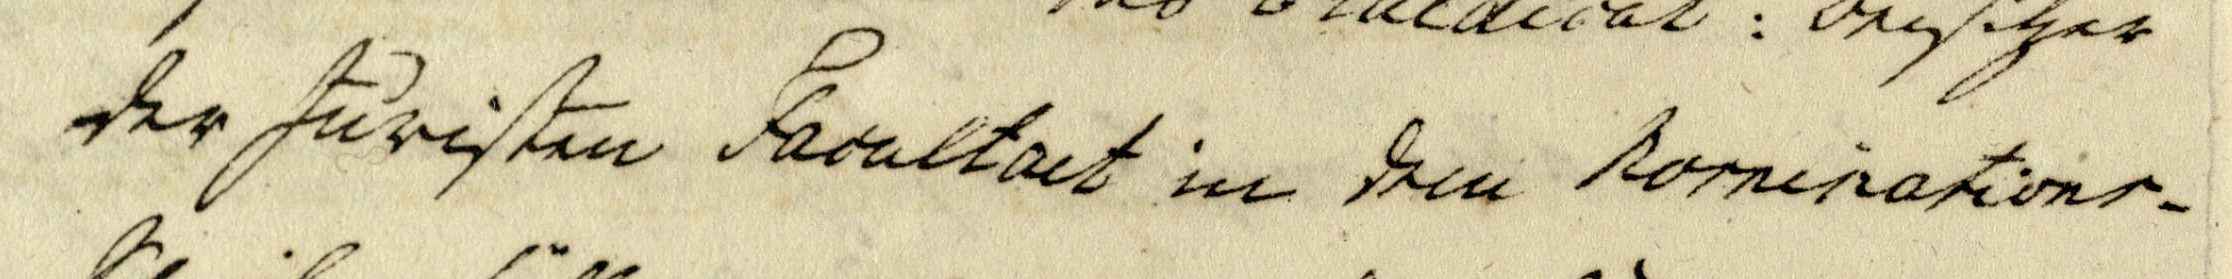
der Juristen Facultaet in dem Nominations
